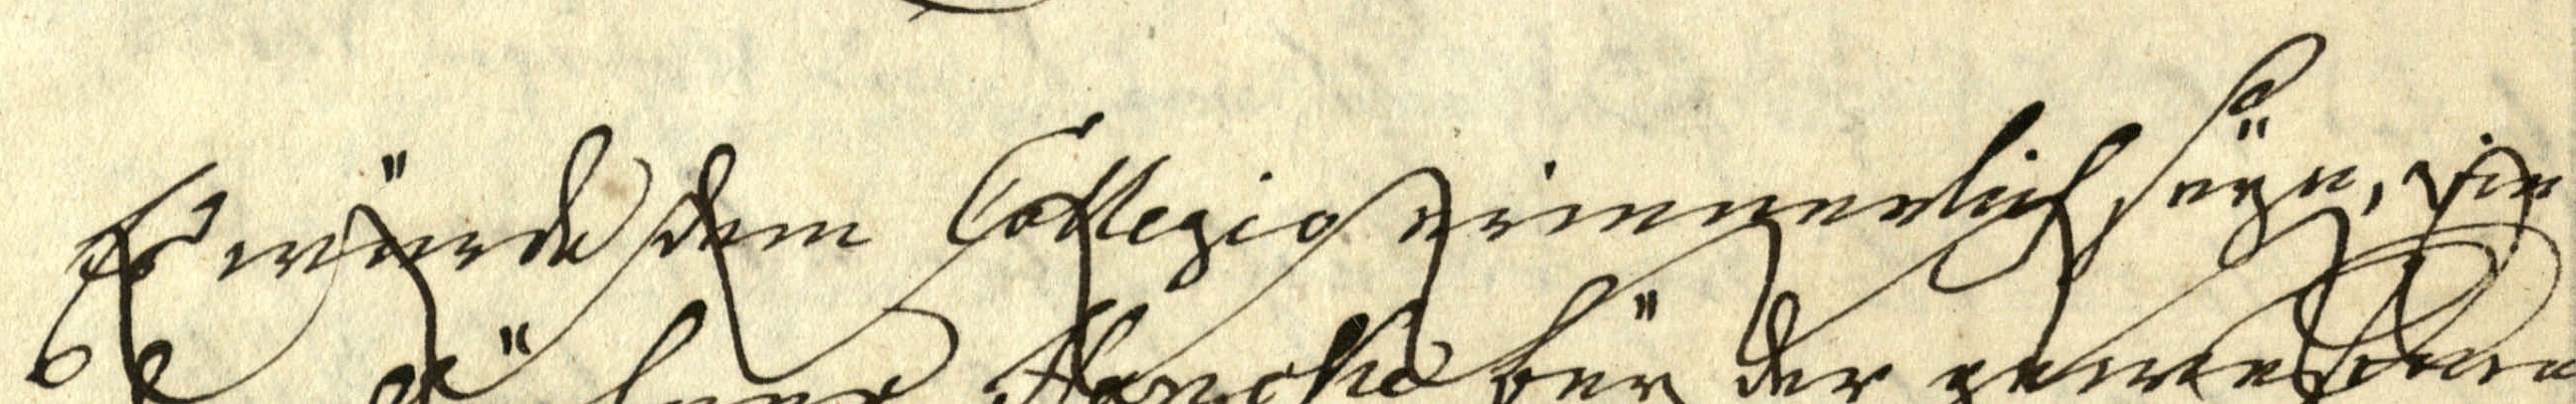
Es würde dem Collegio erinnerlich seÿn, wie
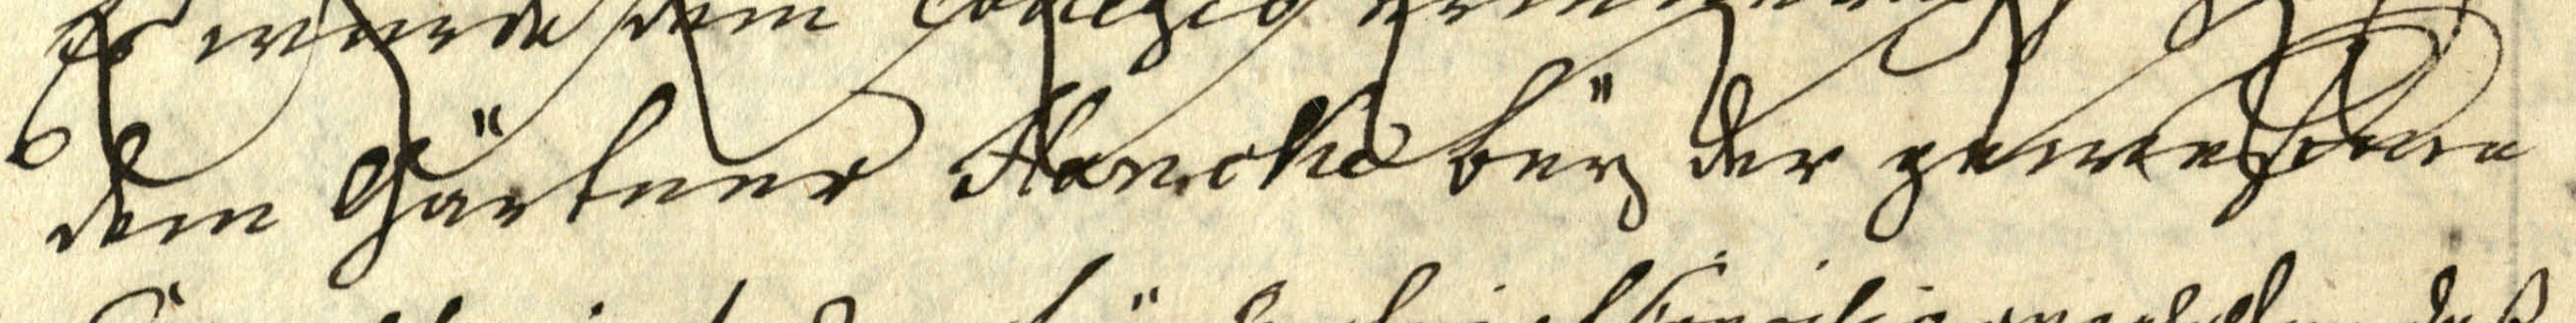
dem Gärtner Hancke beÿ der gewesenen
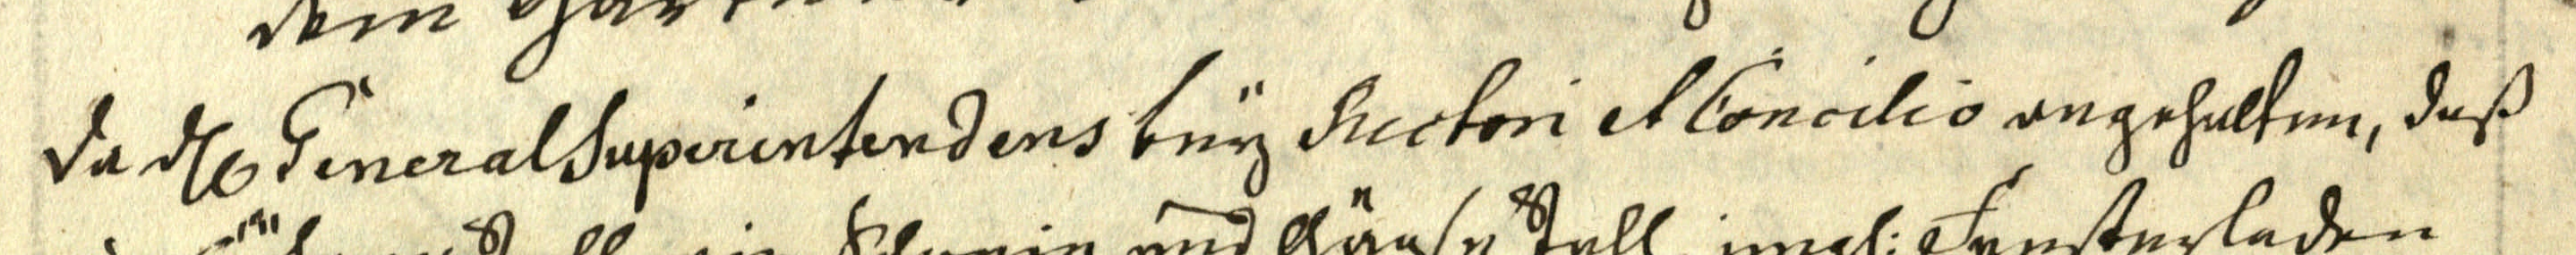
Da dh GeneralSuperintendent beÿ Rectori et Concilio angehalten, daß
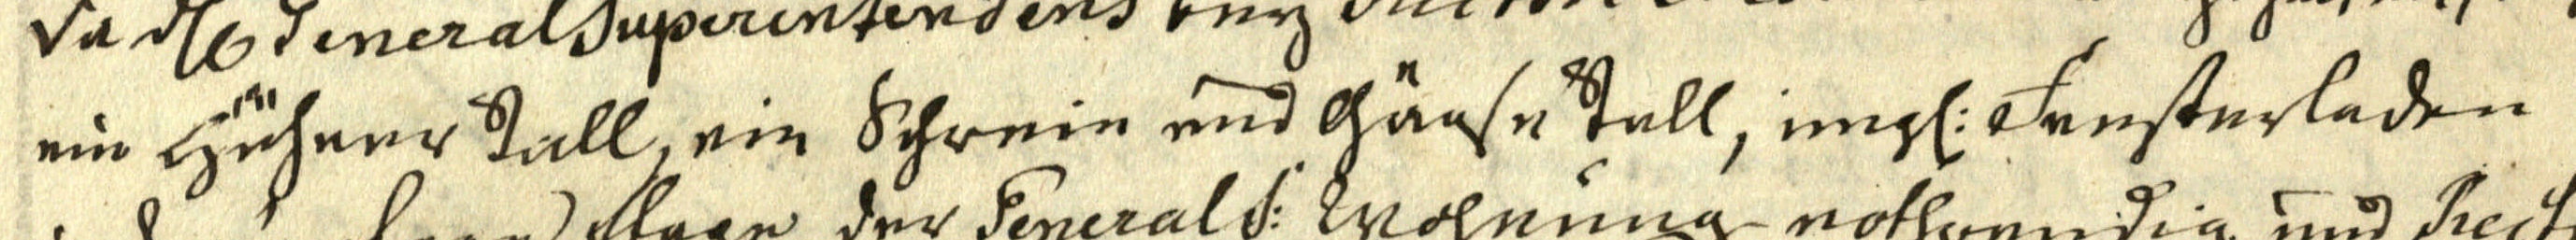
ein Hühner Stall, ein Schwein und Gänse Stall, imgl. Fensterladen
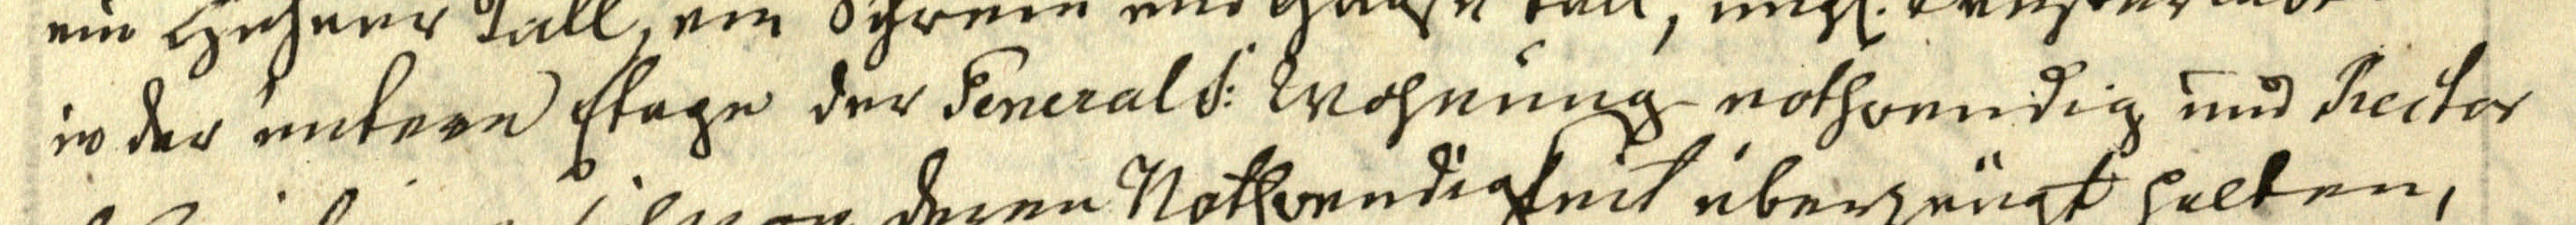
in der untern Etage der GeneralS. Wohnung nothwendig und Rector
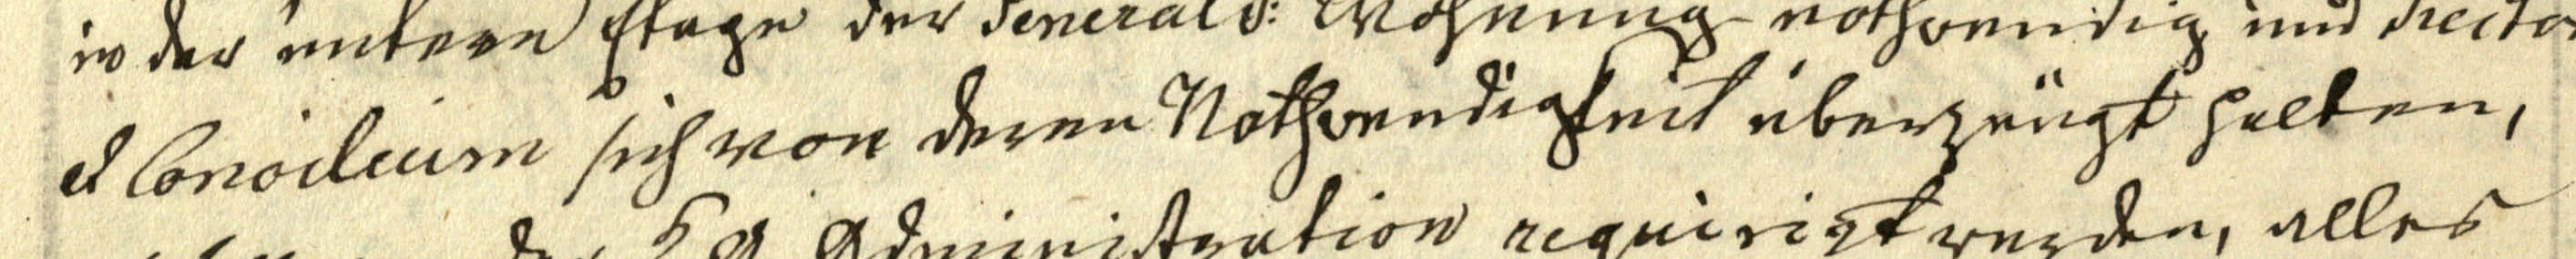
et Concilium sich von deren Nothwendigkeit überzeugt halten,
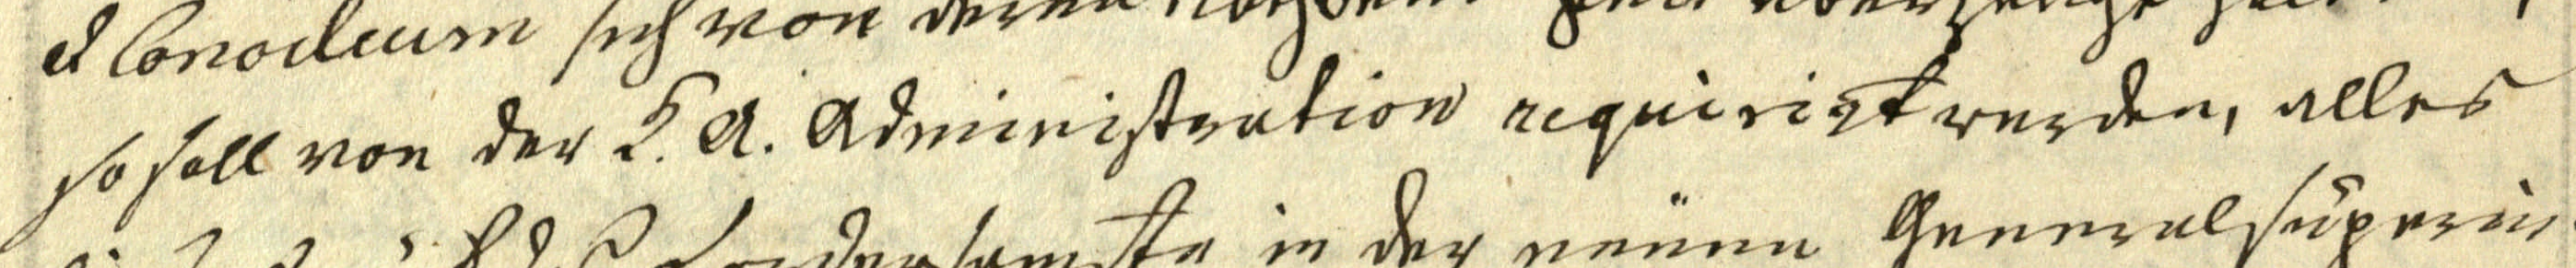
so soll von der K. M. Administration requirirt werden, alles
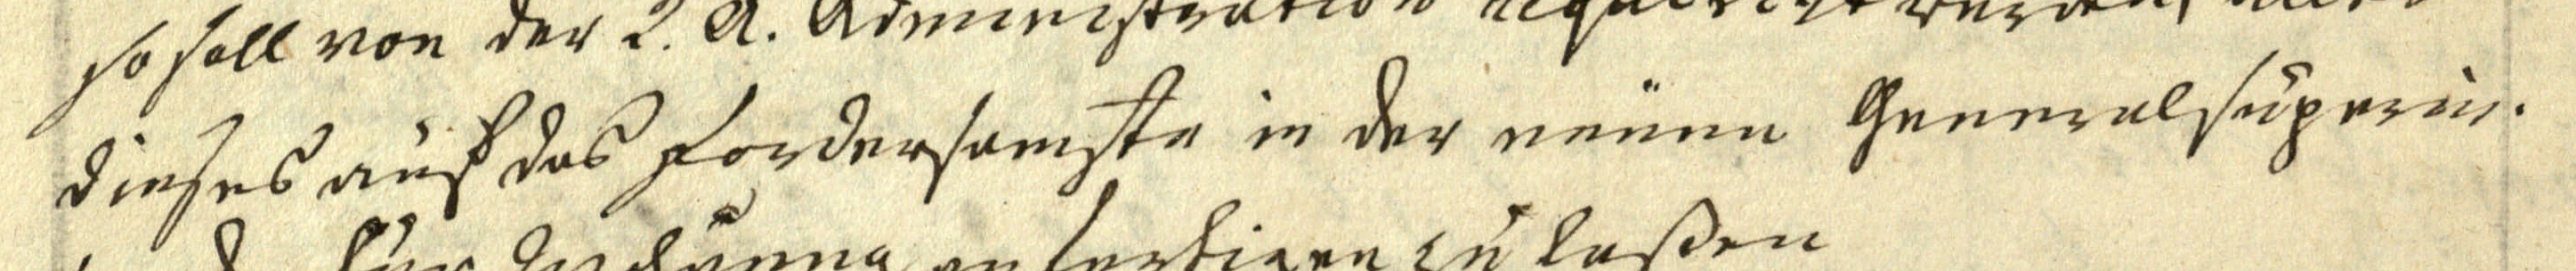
dieses auf das fordersamste in der neuen Generalsuperin¬
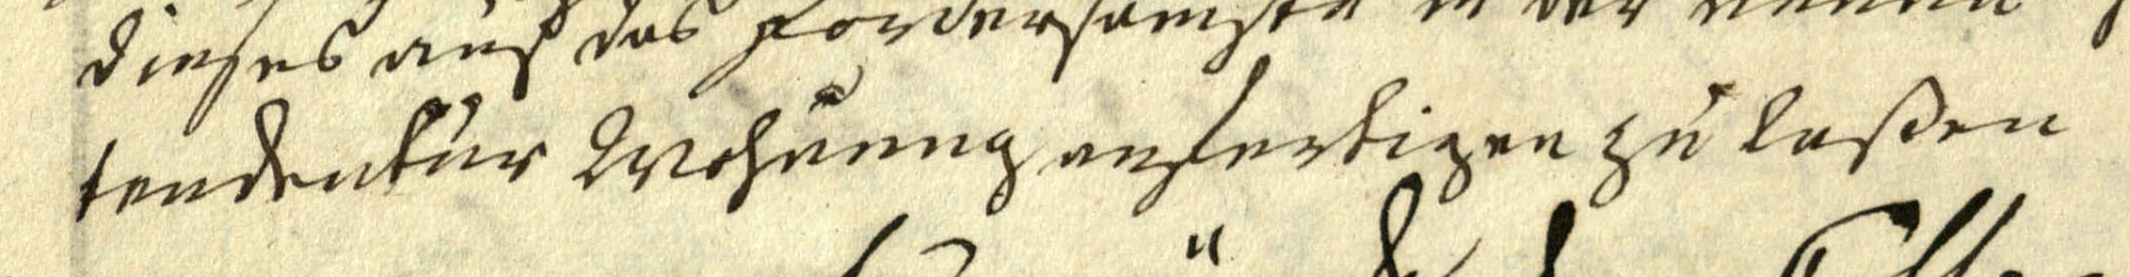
tendentur Wohnung anfertigen zu laßen.
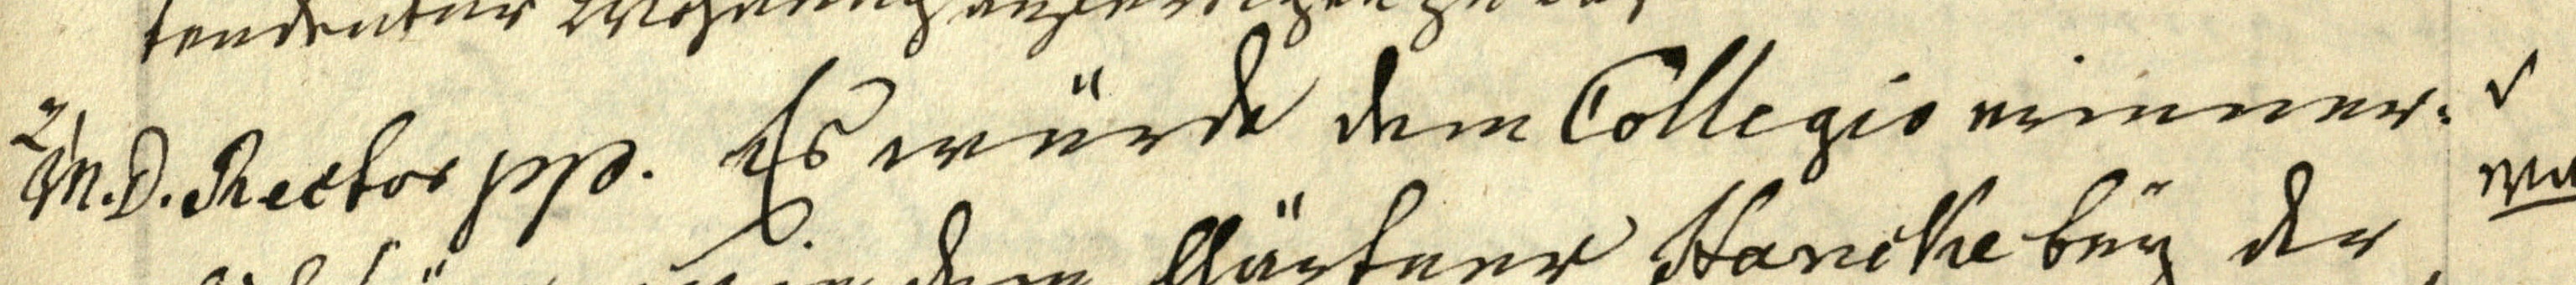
2. M. D. Rector pp. Es würde dem Collegio erinner¬
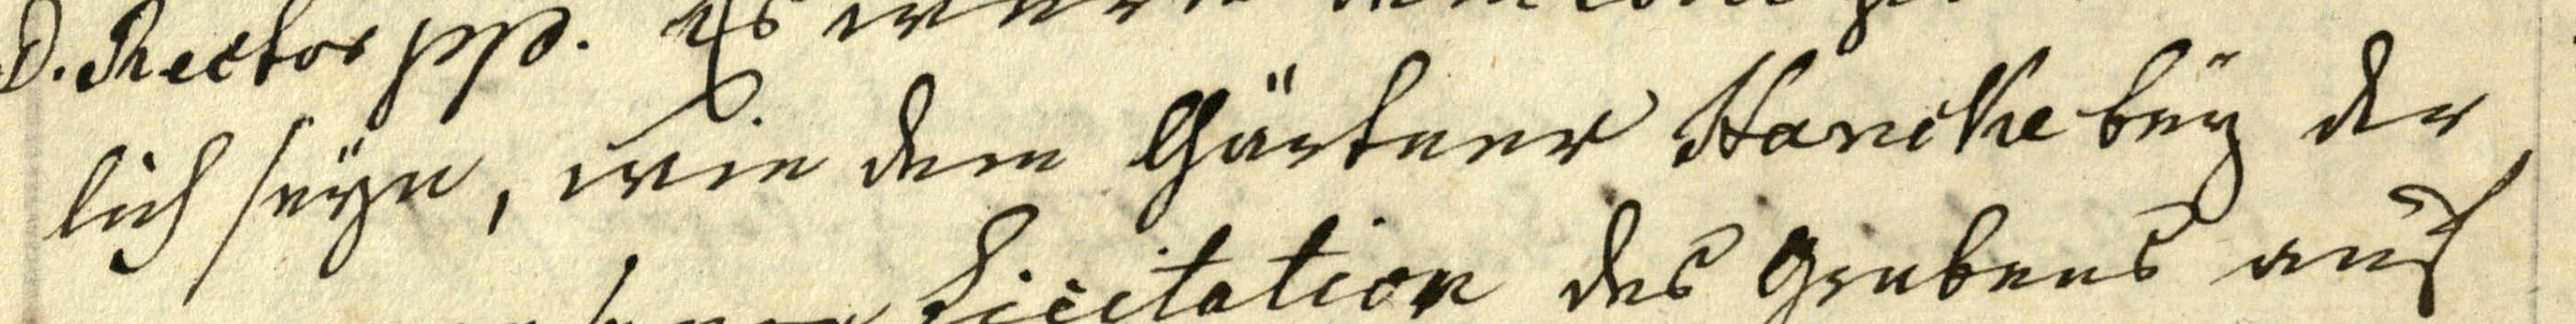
lich seÿn, wie dem Gärtner Hancke beÿ der
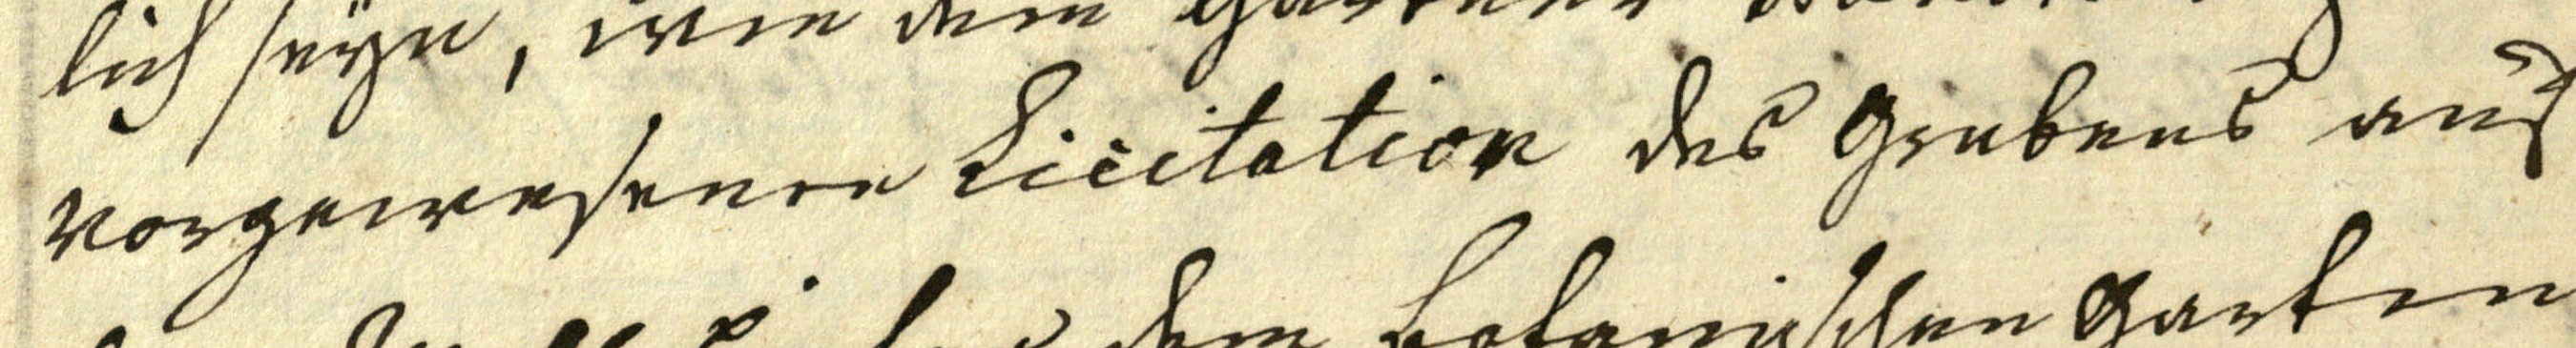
vorgewesenen Licitation des Grabens auf
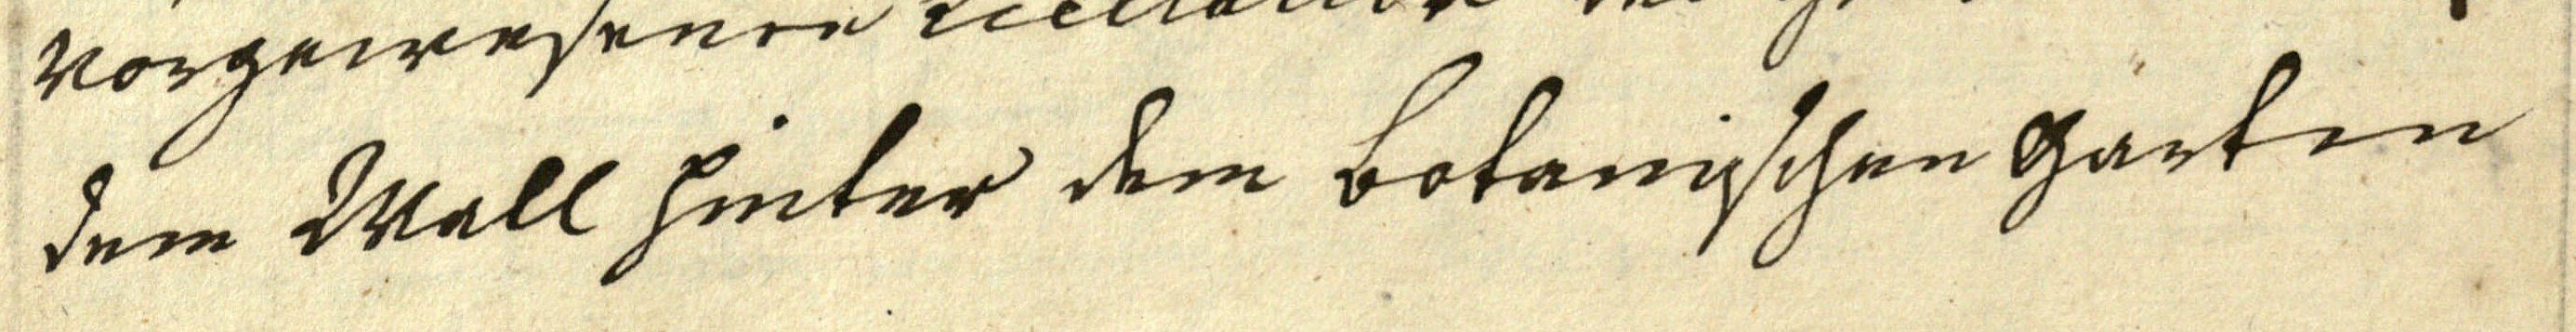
dem Wall hinter dem Botanischen Garten
